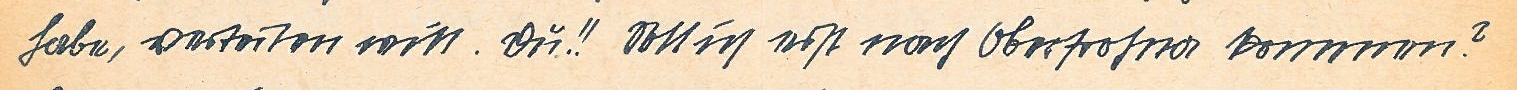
habe, verteilen will. Du!! Soll ich erst nach O. kommen?
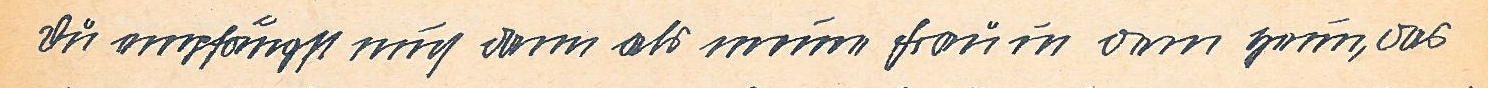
Du empfängst mich dann als meine Frau in dem Heim, das
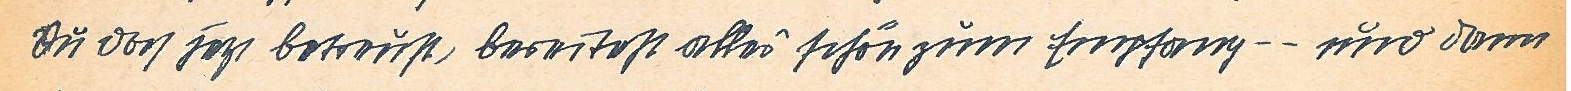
Du doch jetzt betreust, bereitest alles schön zum Empfang – – und dann
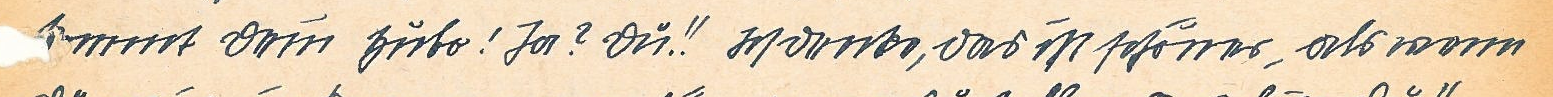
kommt Dein Hubo! Ja? Du!! Ich denke, das ist schöner, als wenn
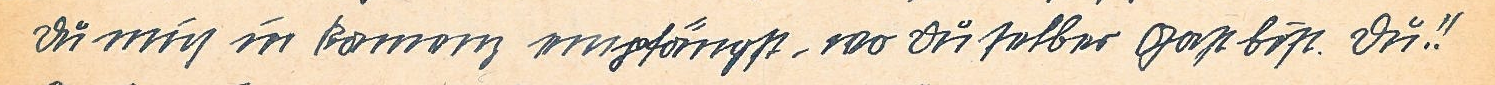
Du mich in K. empfängst, wo Du selber Gast bist. Du!!
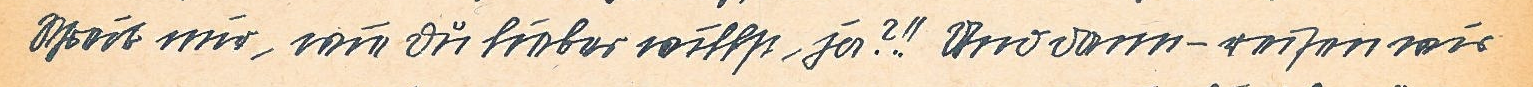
Schreib mir, wie Du lieber willst, ja?!! Und dann – reisen wir
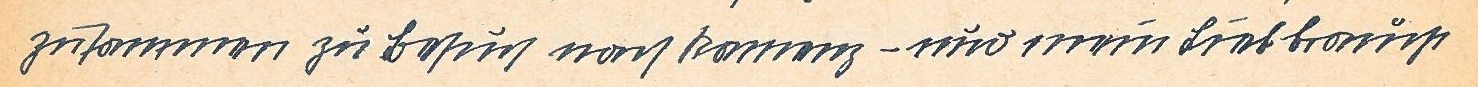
zusammen zu Besuch nach K. – und mein Lieb braucht
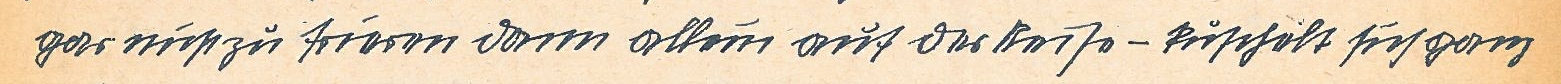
gar nicht zu frieren dann allein auf der Reise – kuschelt sich ganz
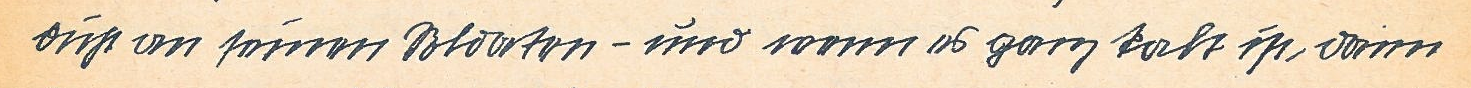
dicht an seinen Soldaten – und wenn es ganz kalt ist, dann
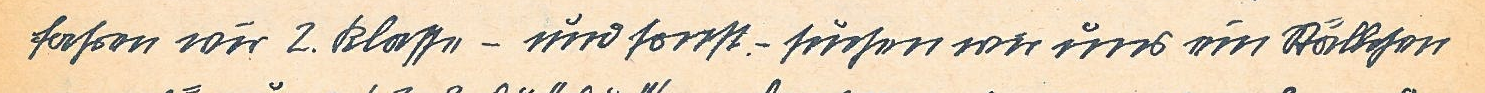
fahren wir 2. Klasse – und sonst. – suchen wir uns ein Ställchen
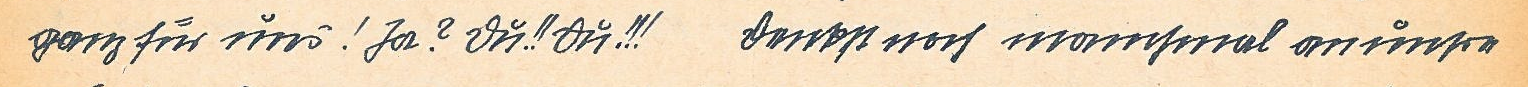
ganz für uns! Ja? Du!! Du!!! Denkst noch manchmal an unsere
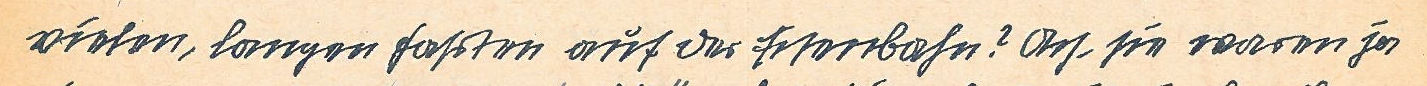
vielen, langen Fahrten auf der Eisenbahn? Ach, sie waren ja
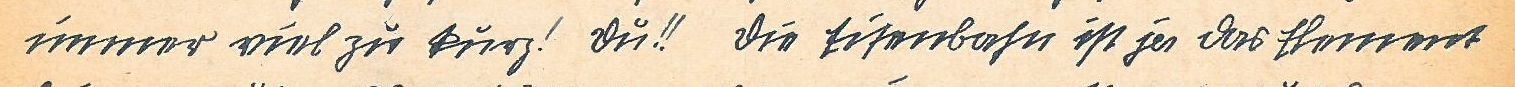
immer viel zu kurz! Du!! Die Eisenbahn ist ja das Element
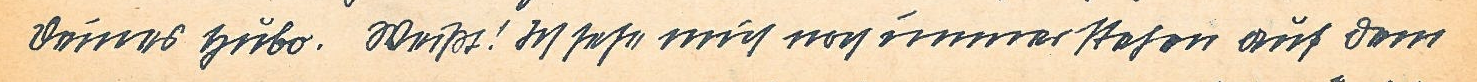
Deines Hubo. Weißt! Ich sehe mich noch immer stehen auf dem
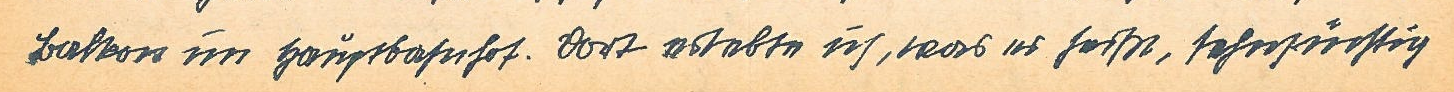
Balkon im Hauptbahnhof. Dort erlebte ich, was es heißt, sehnsüchtig
